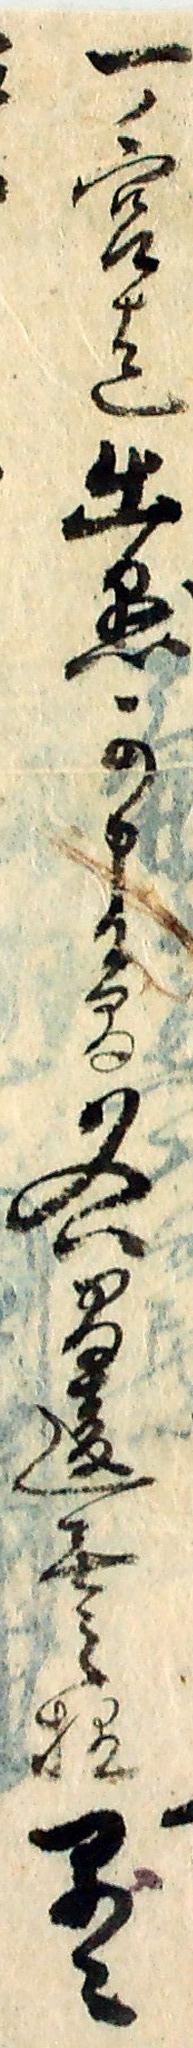一ノ宮迄出懸可申候間各間違無之様早々
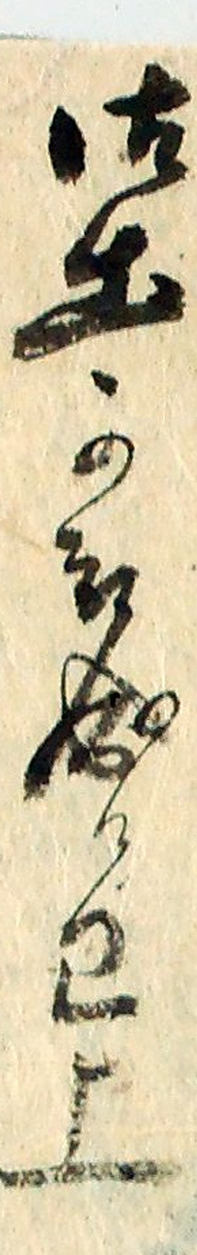御出可被成候已上
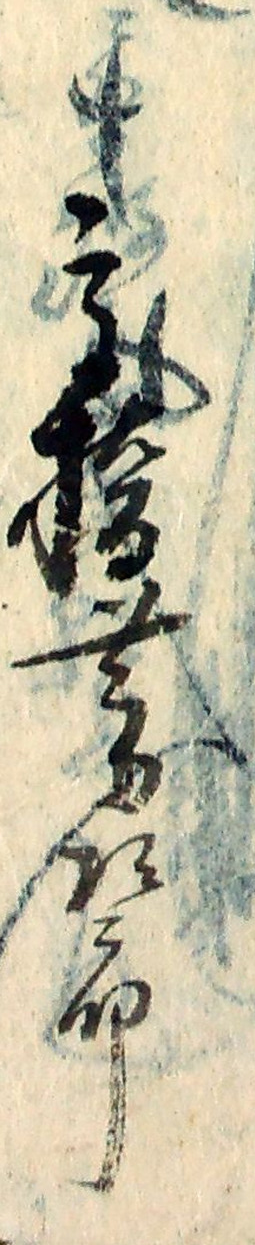高橋芳次郎
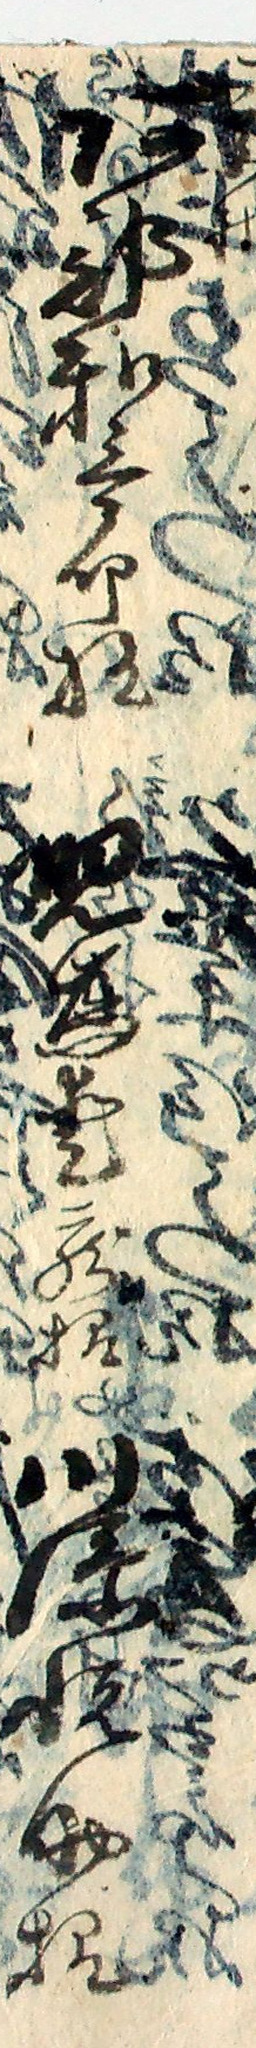阿部和三郎様児島愛蔵様川添悦助様
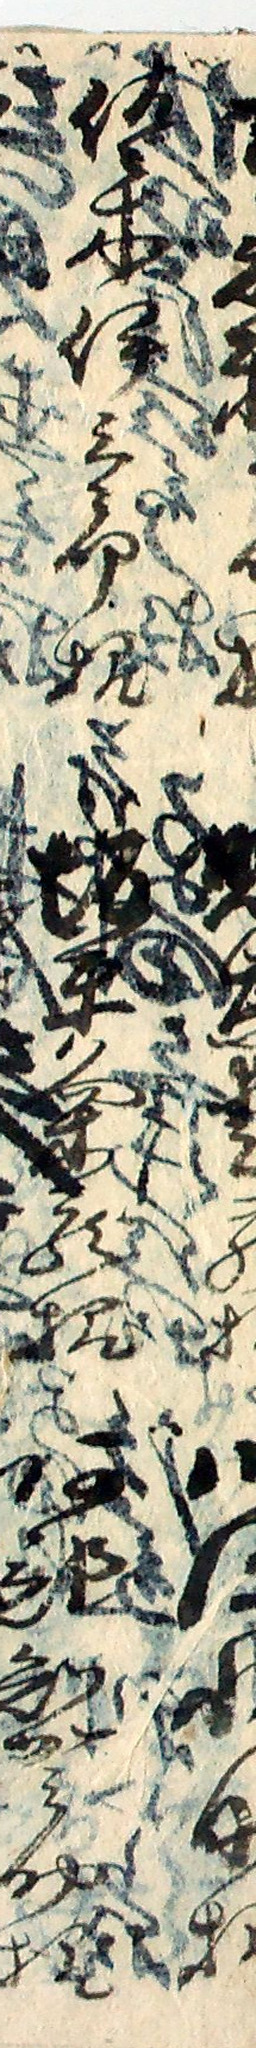佐々木伊三郎様坂東粂蔵様阿部知賀助様

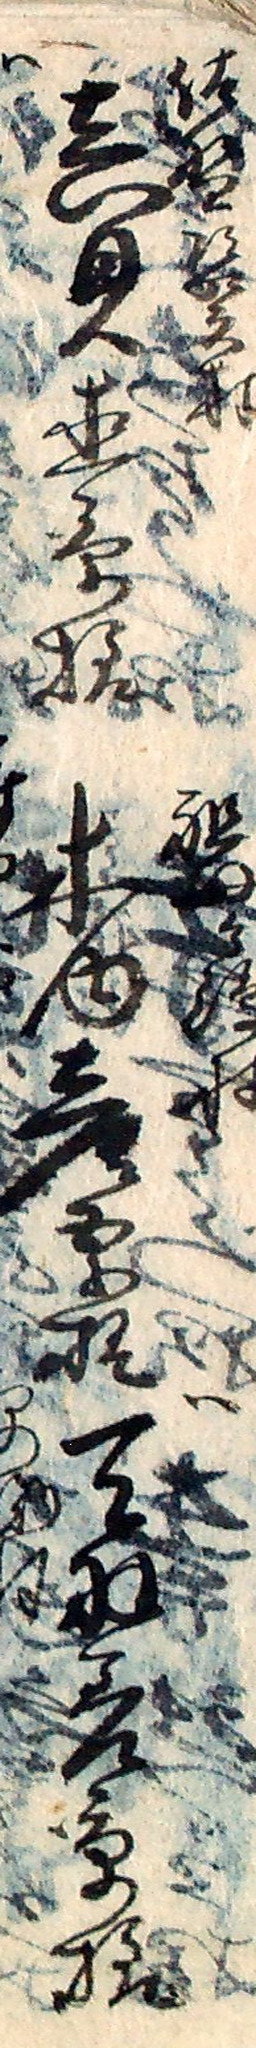真貝直兵衛様木内彦五郎様天羽善兵衛様
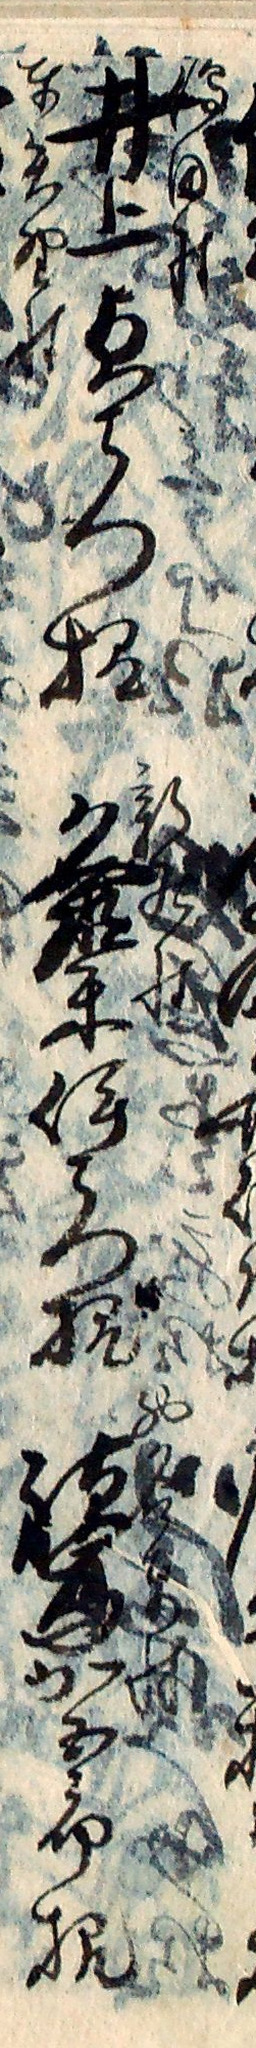井上貞右衛門様久須米伊右衛門様禎島加五郎様

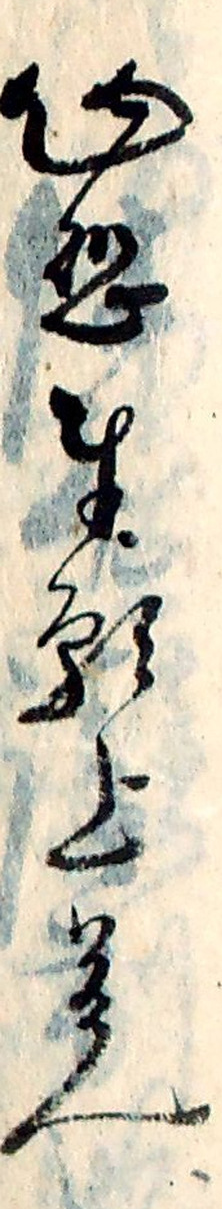乍恐奉願上覚
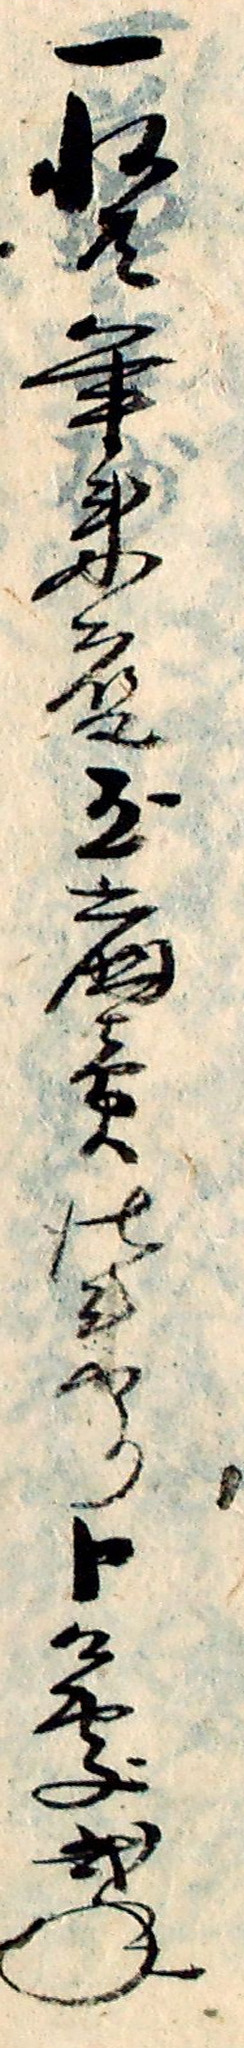一私共年来藍玉商売仕来り申候処此年
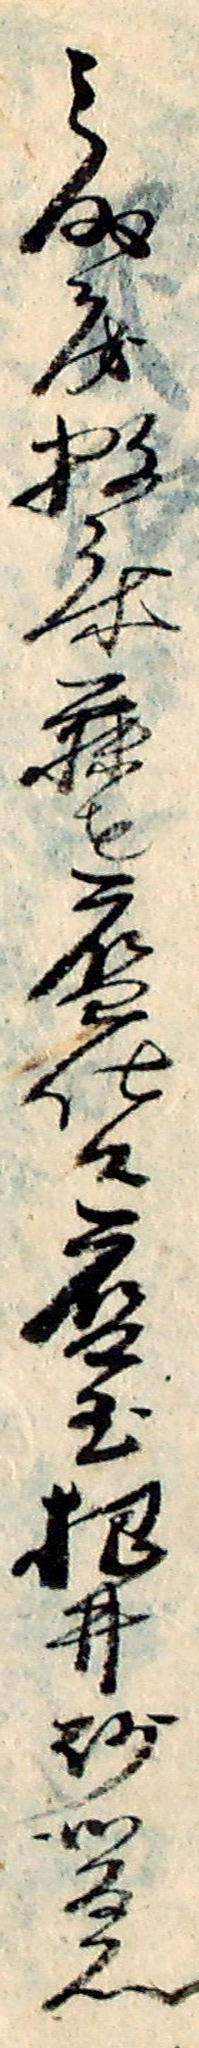之儀も数床寐せ藍仕候藍玉根井砂弐百石
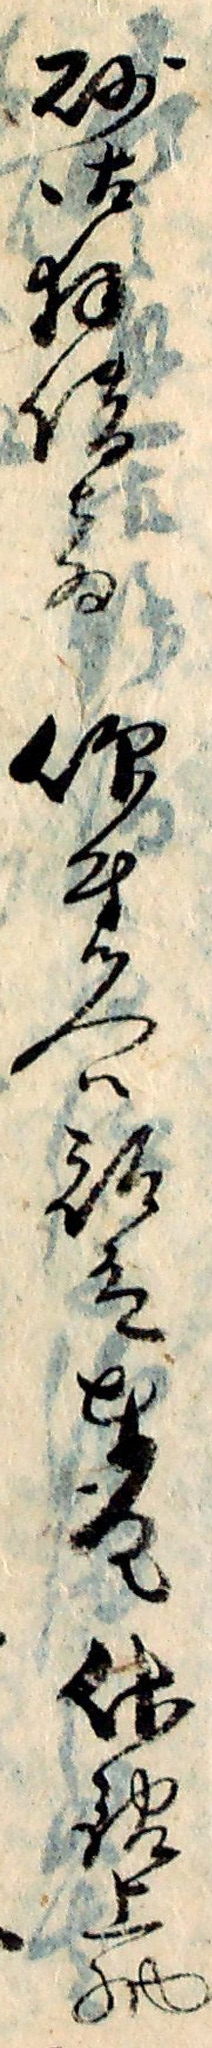砂御拝借被為仰付候へは難有奉存候代銀上納
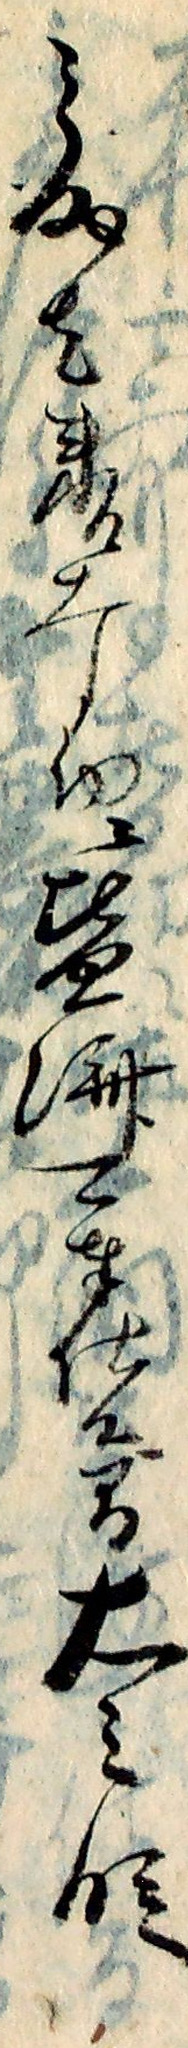之儀は来る十一月切に皆済可奉仕候間右之段
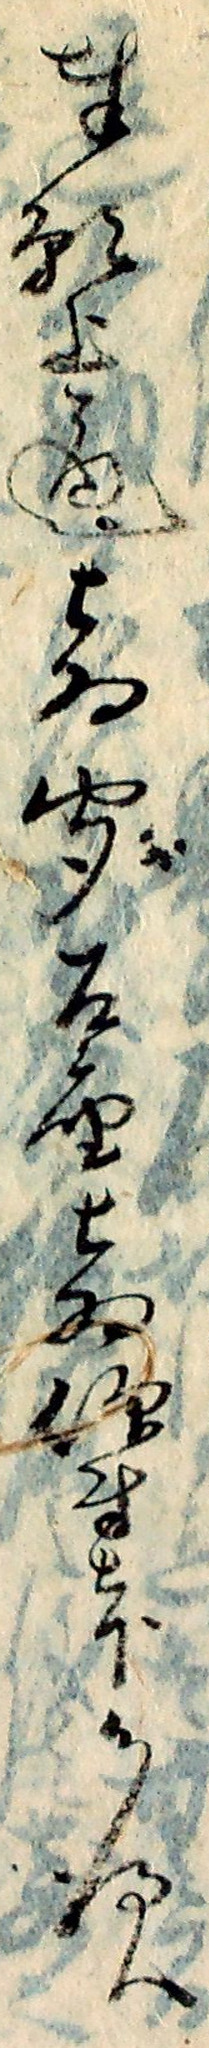奉願上通被為聞召届被為仰付被下候得は
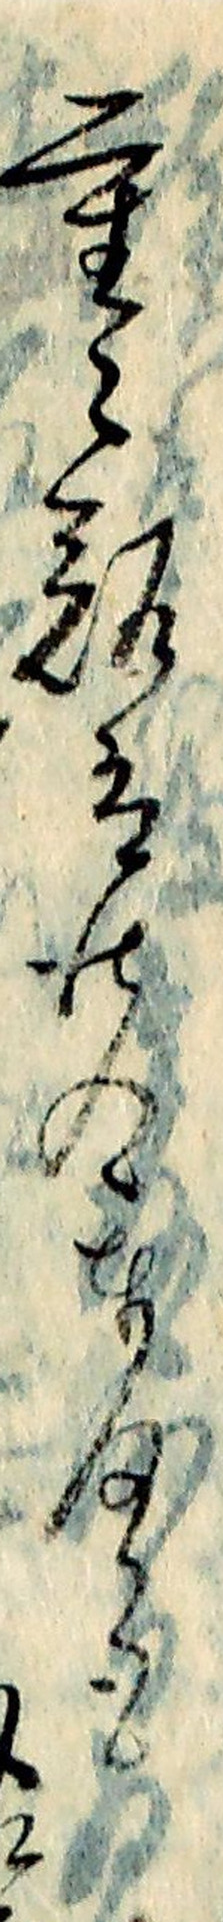重々難有仕合奉存候以上
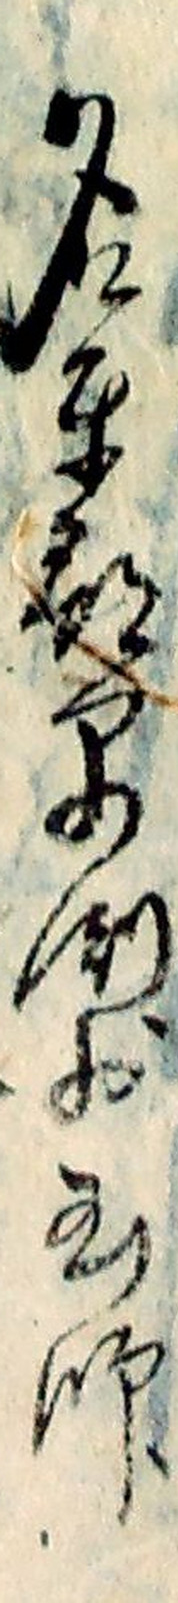名東郡早淵村玉師
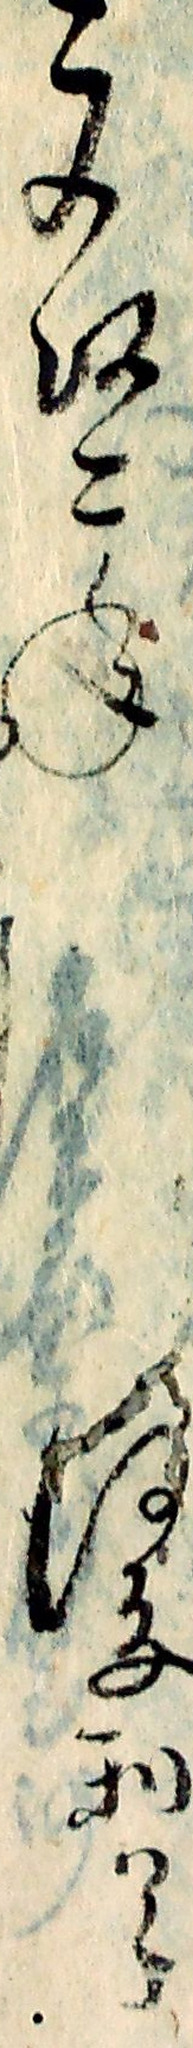文政二年後藤利八郎
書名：諸御願書控(後藤氏壱番）
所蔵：鳴門教育大学 Naruto University of Education
